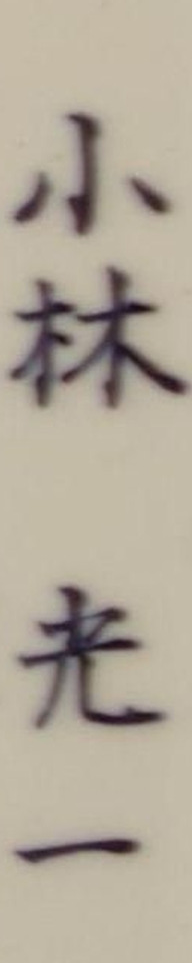小林光一
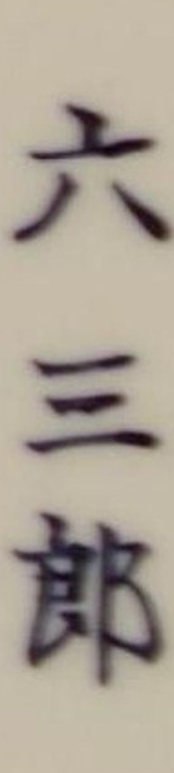六三郎
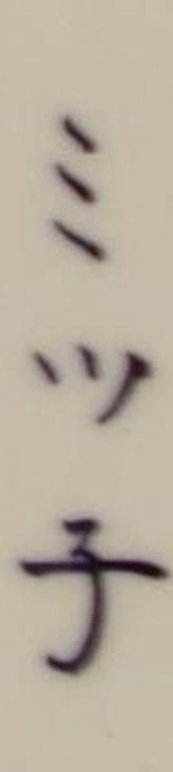ミツ子
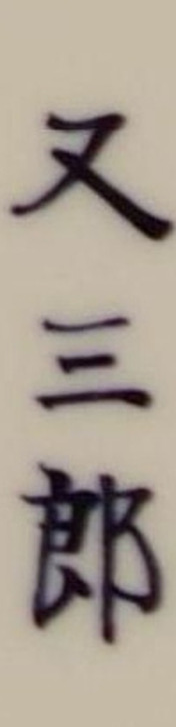又三郎
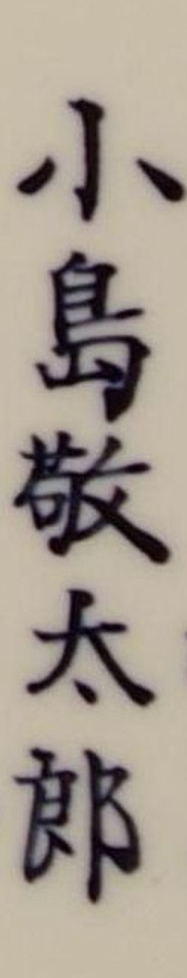小島敬太郎
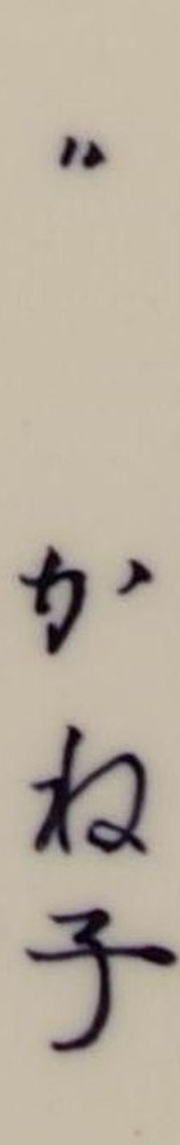かね子
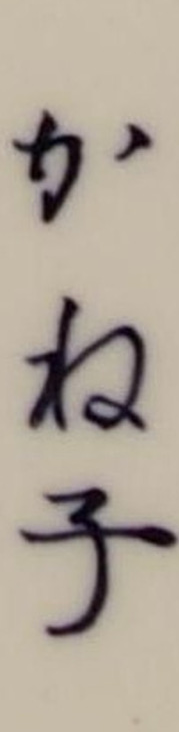かね子
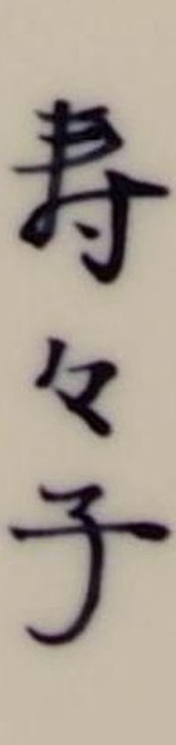寿々子
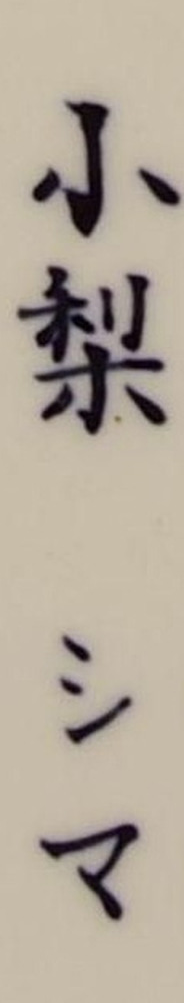小梨シマ
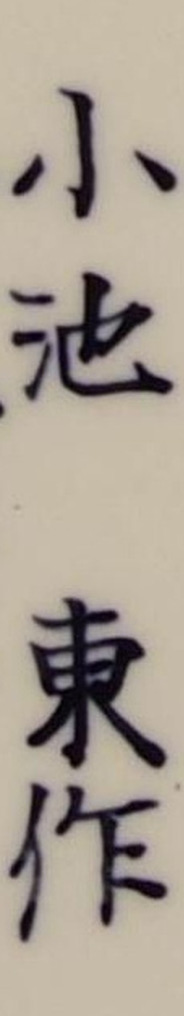小池東作
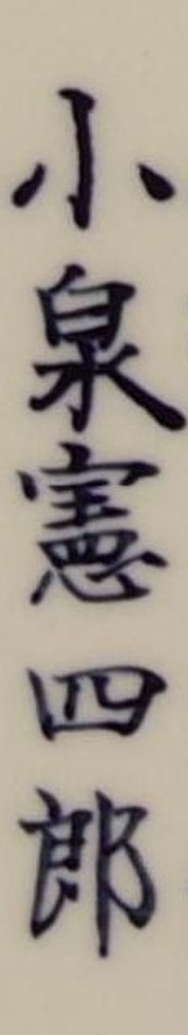小泉憲四郎
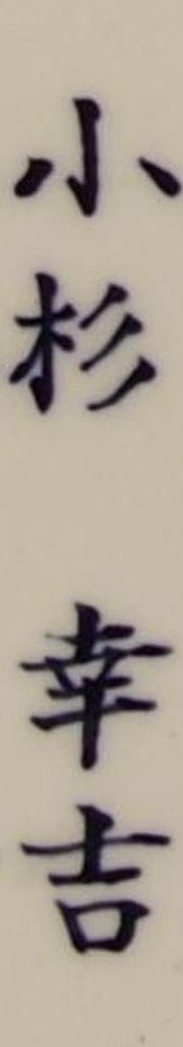小杉幸吉
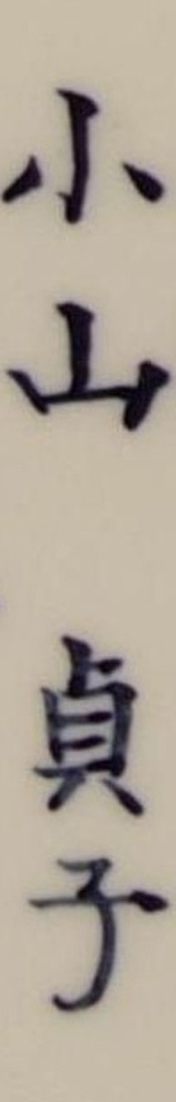小山貞子
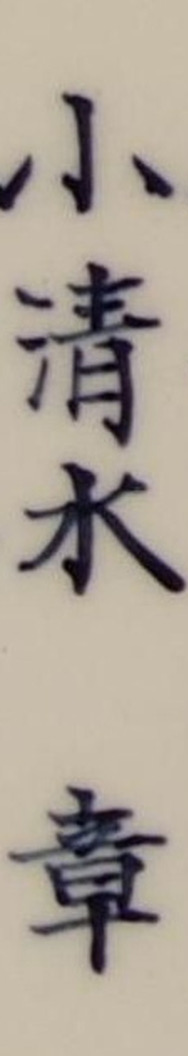小清水章
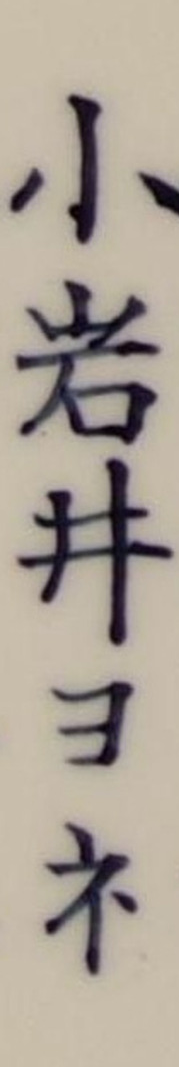小岩井ヨネ
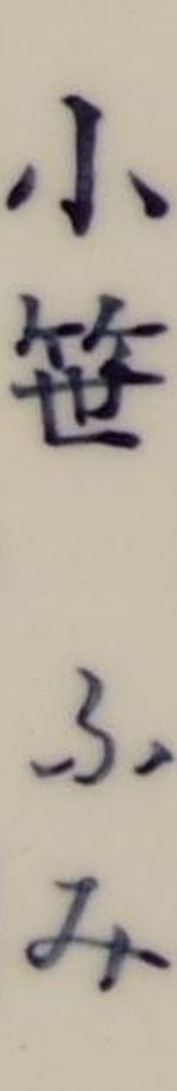小笹ふみ
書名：M~S
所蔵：高野山金剛峯寺
